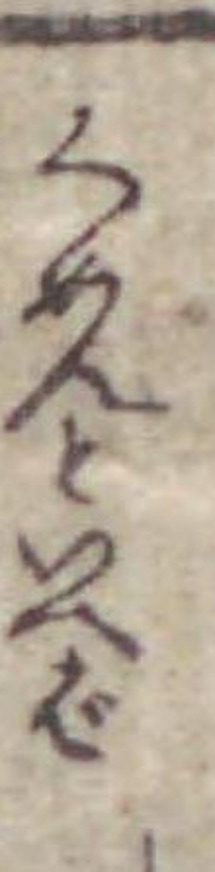くめんといへば
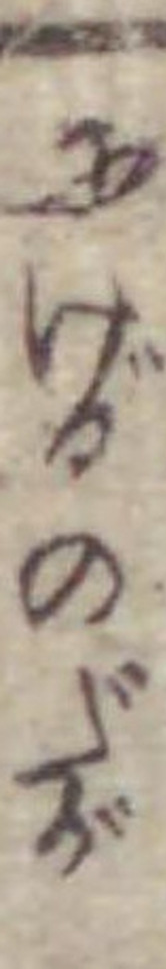にげるのだが
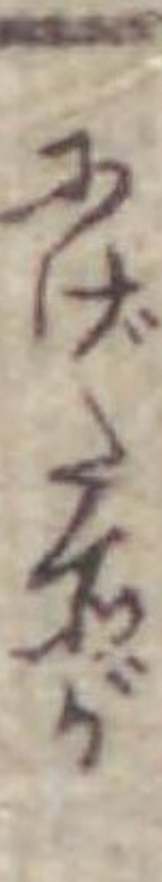にげた所が
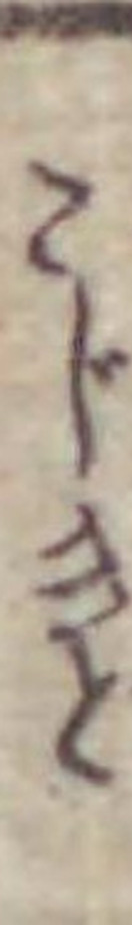こじきと
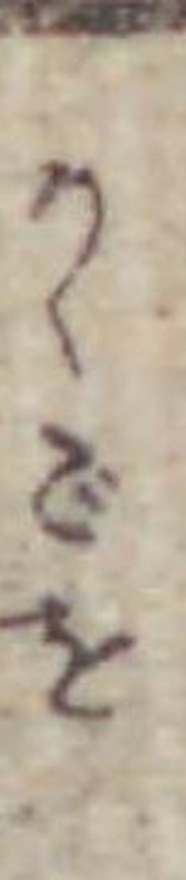かくごを
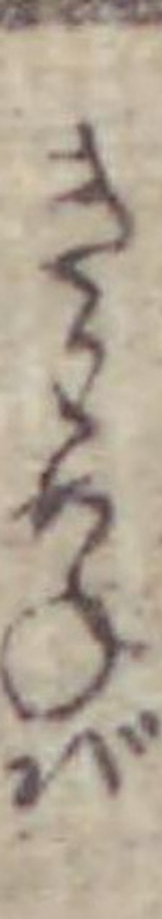きわめねば
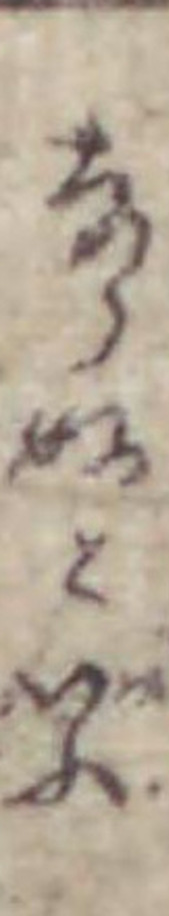ならぬといふ
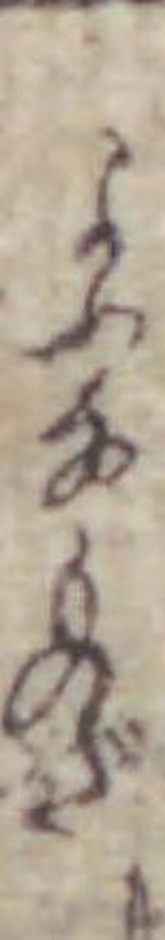よふなものだ
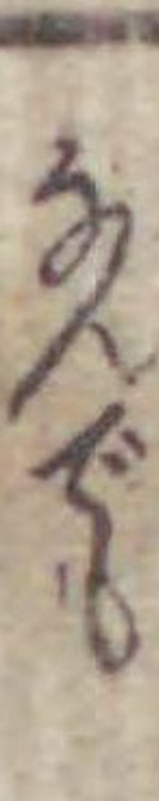なんでも
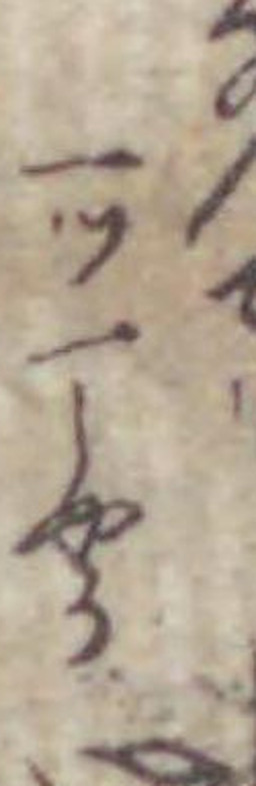一ツ一しやう
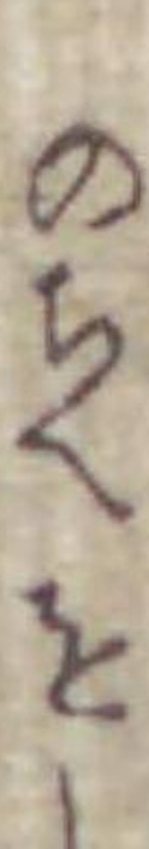のちへを
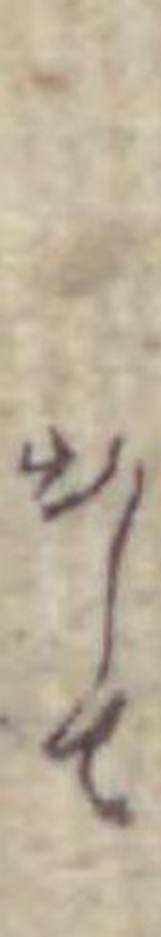出して
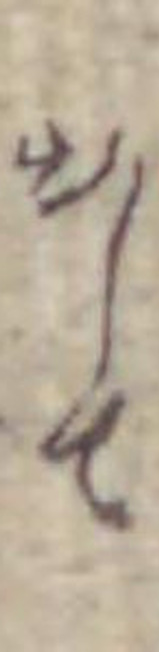出して
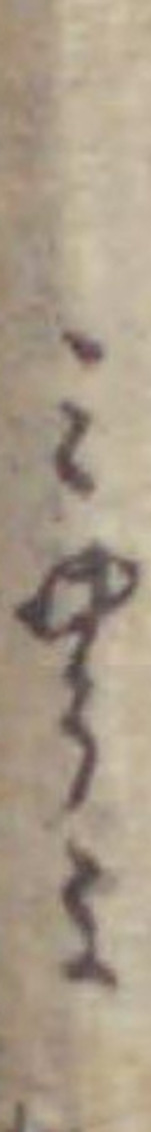みやうそ
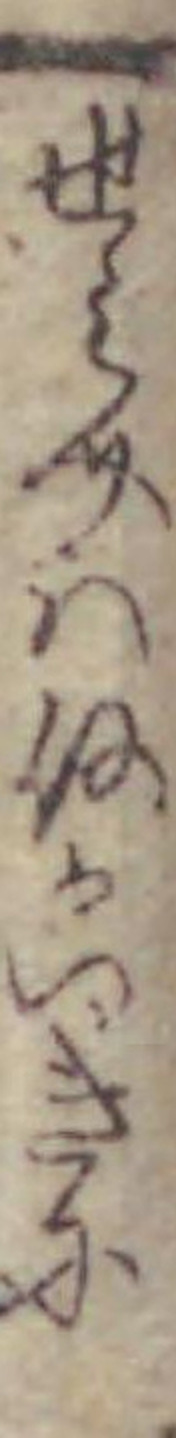世之介は何かいきに
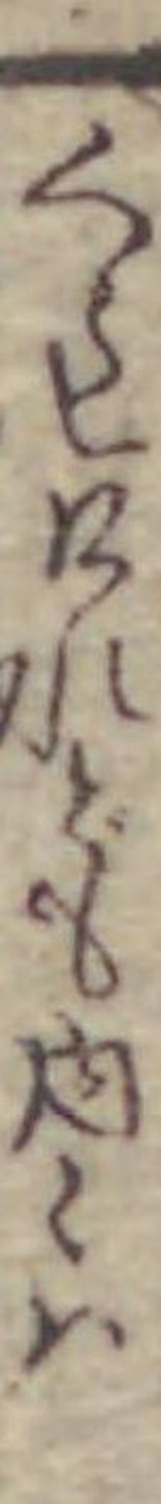くらしけれども内ゝは
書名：嗚呼不侭世之助噺 : 3巻
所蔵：国立国会図書館 National Diet Library, JAPAN
